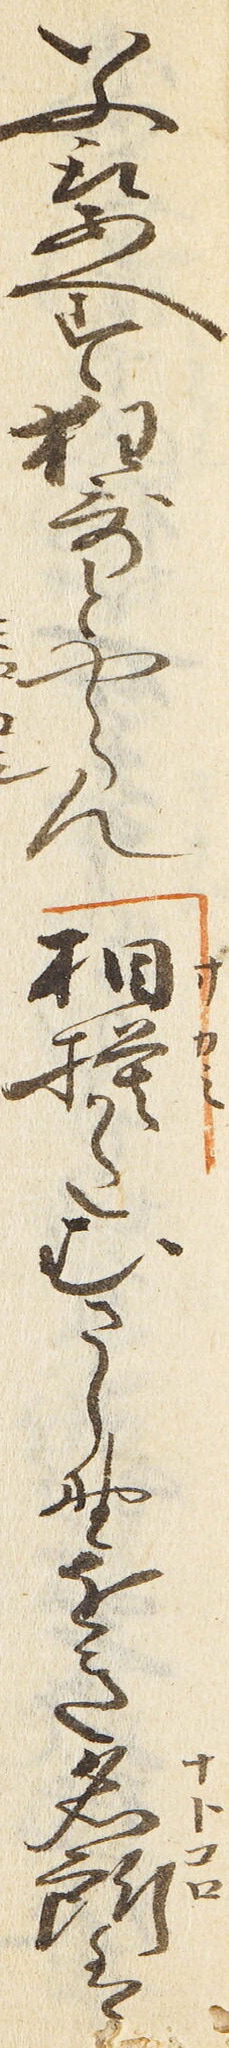いふ取あへす狂歌とやらん「相模かたむさし野近き名所は
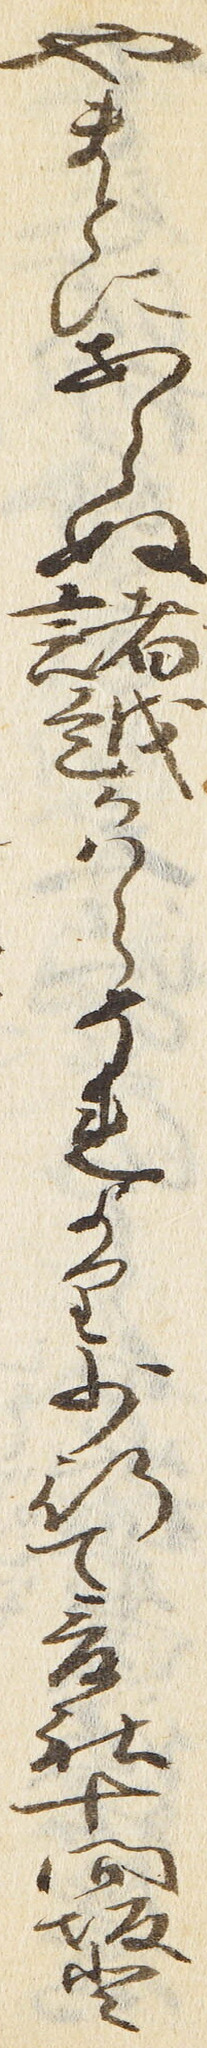やまとにあらぬ諸越かはらそれより少行て爰社十間坂と
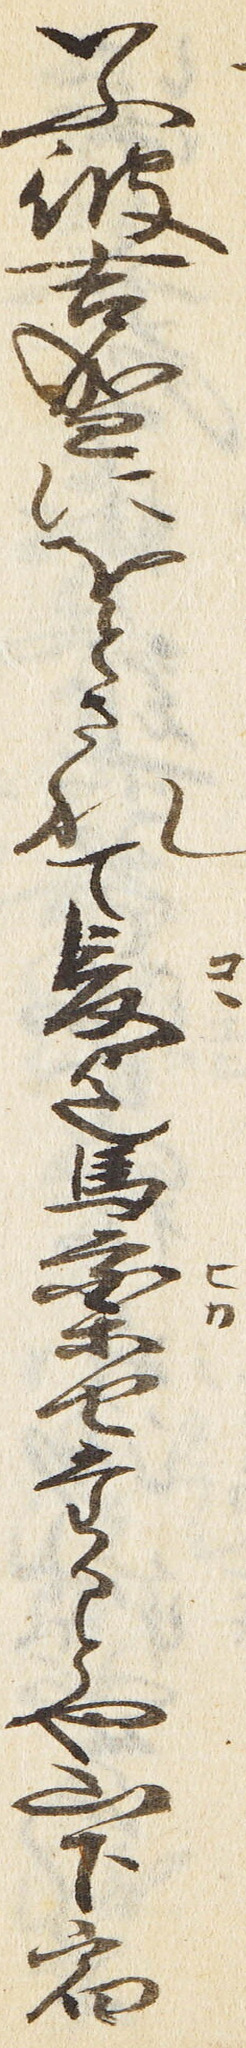いふ彼吉盛にをとされて爰迄馬牽せたるとや山下宿
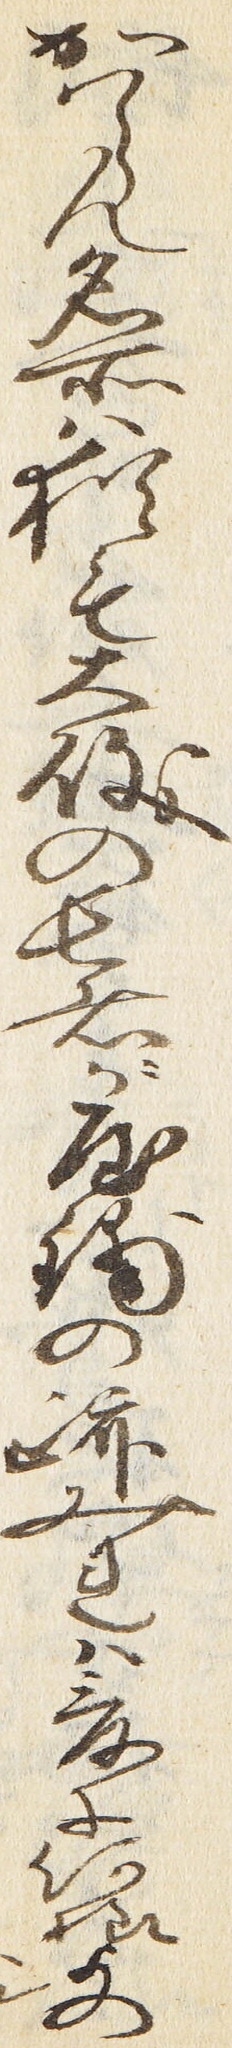かわらん名所は猶も大儀の長者が屋鋪の跡みれは爰に何様よの
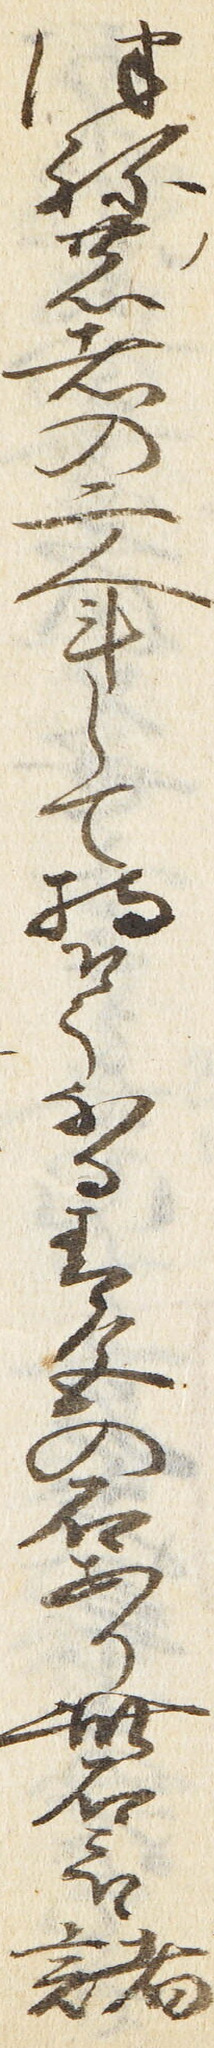つねの者の二人斗して持そうなる青色の石あり此石こそ諸
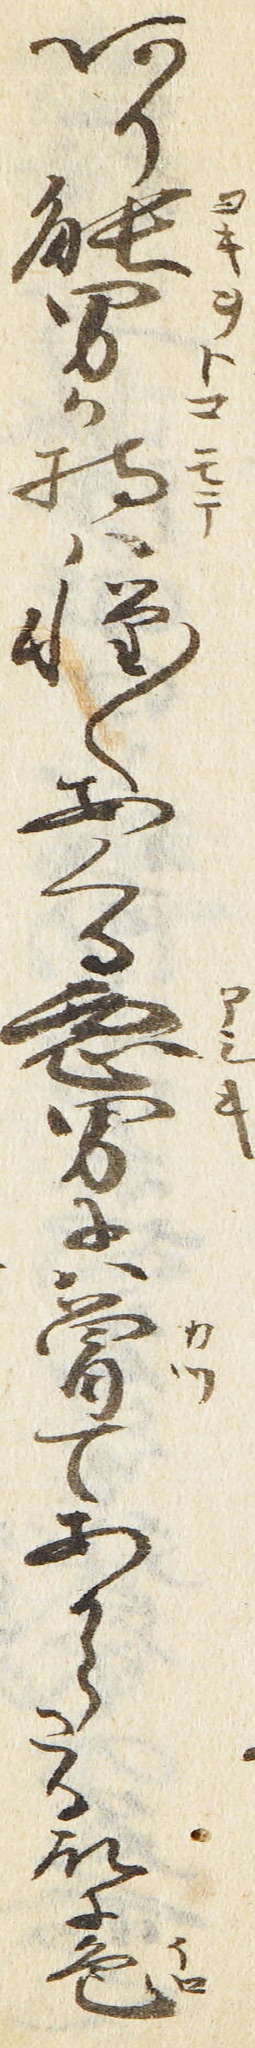あり能男か持は軽〳〵あくる悪男には曽てあからさる故に色
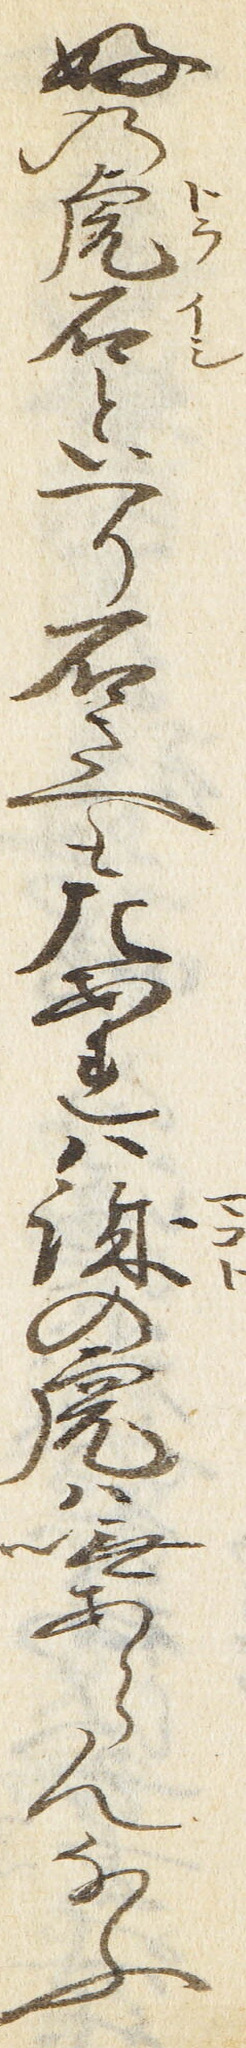好の虎石といへり石さへも左あれは誠の虎は嘸あらんなふ
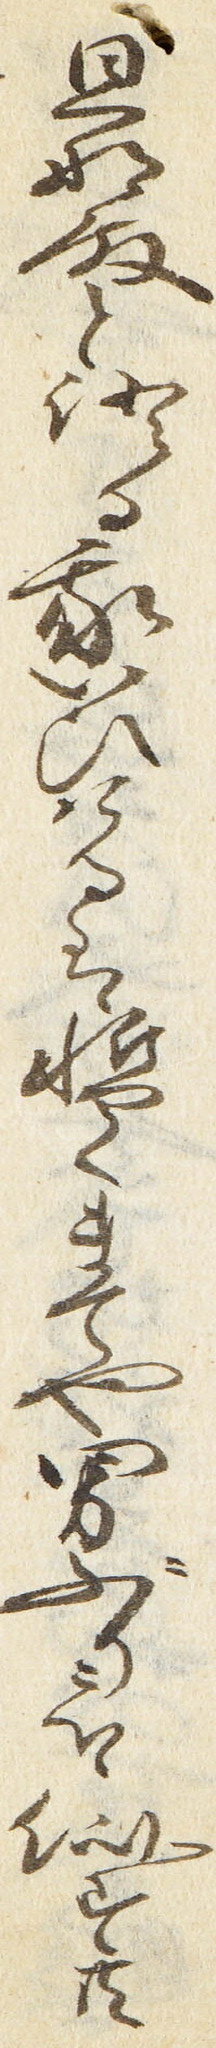旦那殿と語る我いひけるは暫くまてや男ぶりこそ似す共
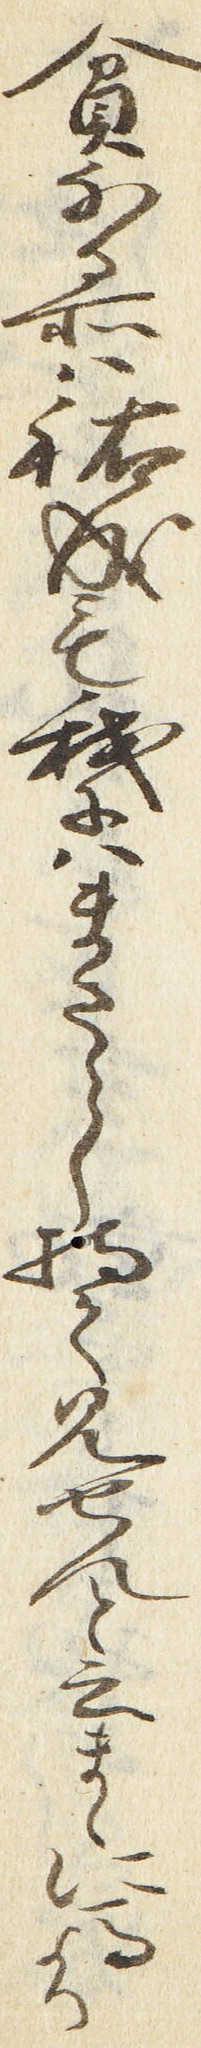貧なる所は祐成も我にはまさらし持て見せんと云まゝに馬より

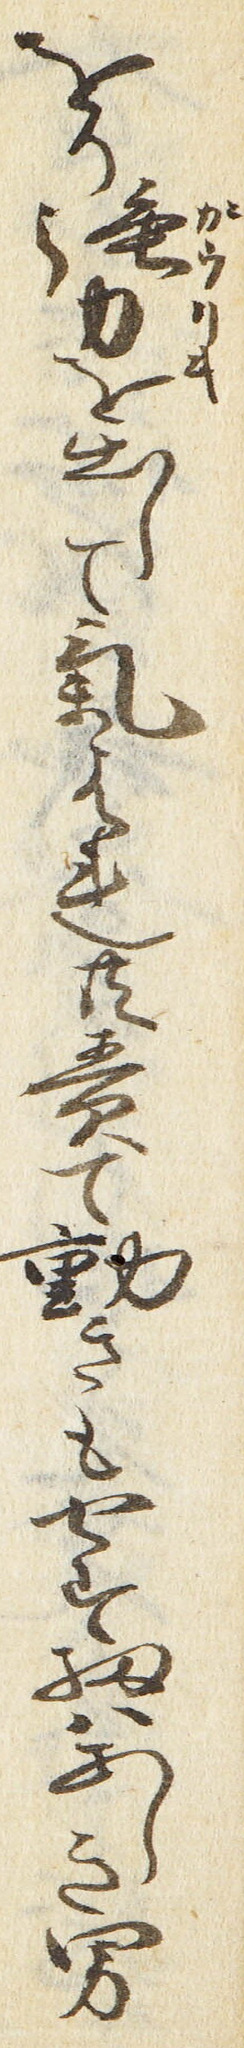をり強力を出して気はれ共責て動きもせす扨はあしき男
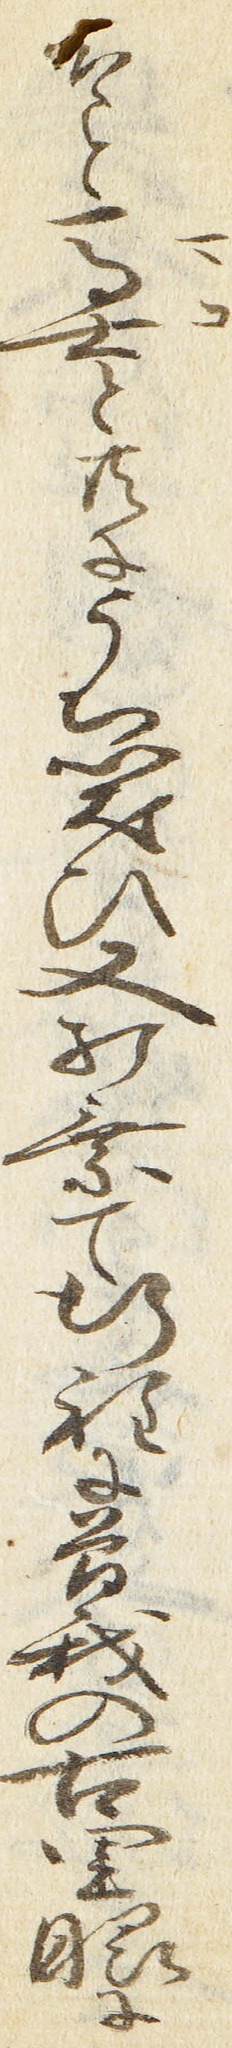そと馬士と共にうち笑ひ又打乗て行程に曽我の古里脇に
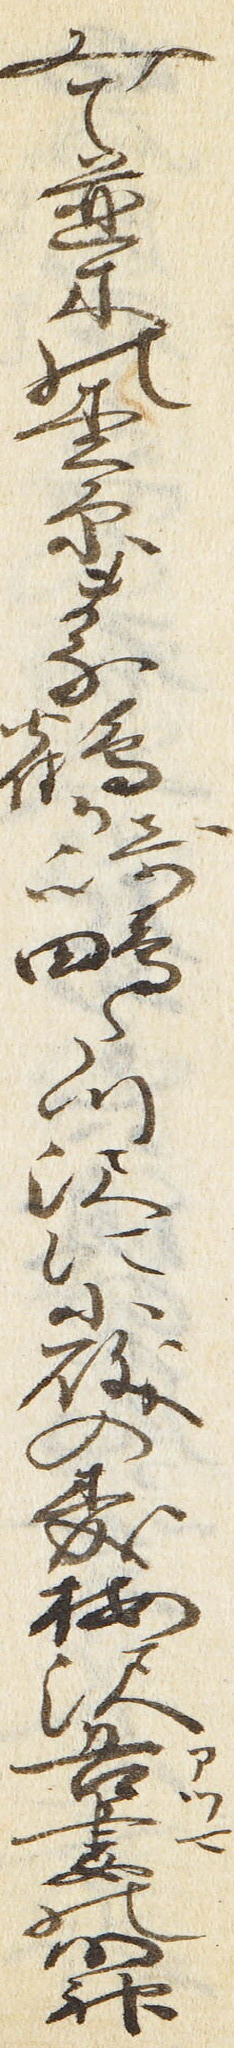みて並木の松原まな鶴か崎鴫たつ沢に小磯の森梅沢吾妻の明神
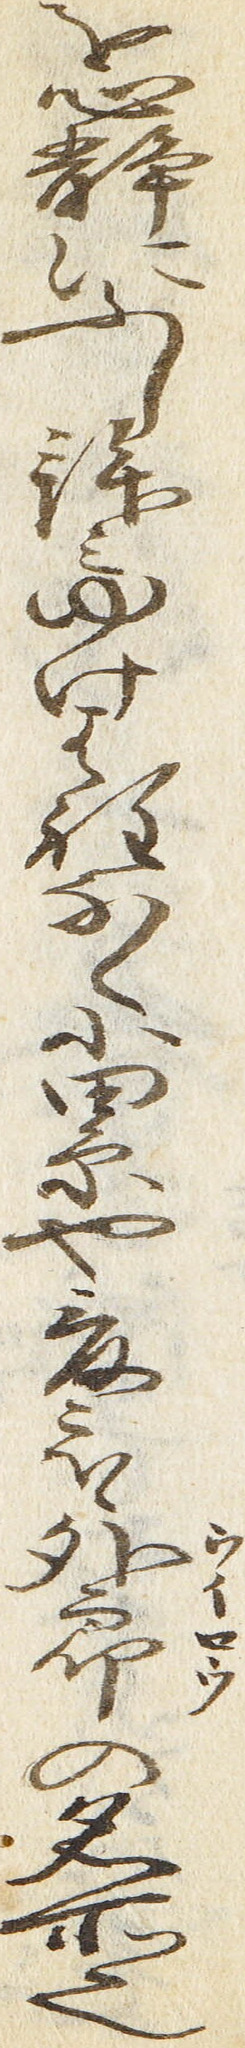を心静にふし拝みゆけは程なく小田原や爰こそ外郎の名所也
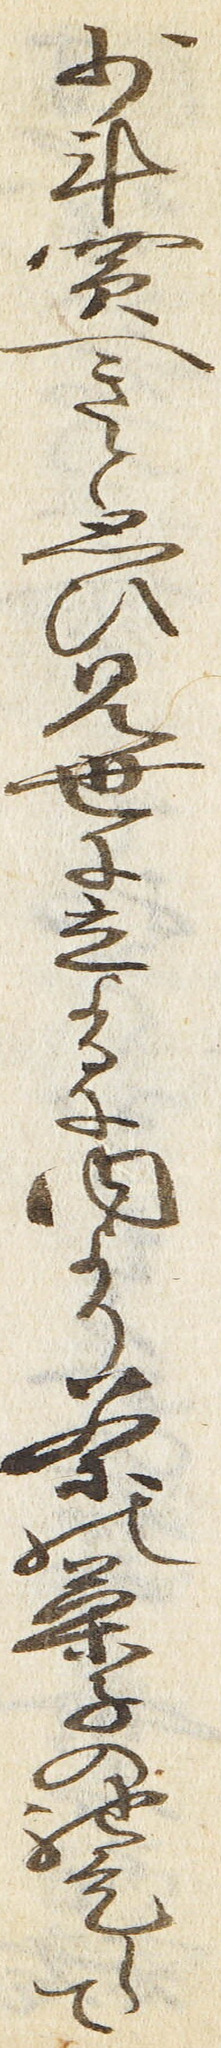少斗買へきと思ひ見世に立よるに内より茶の菓子の馳走して
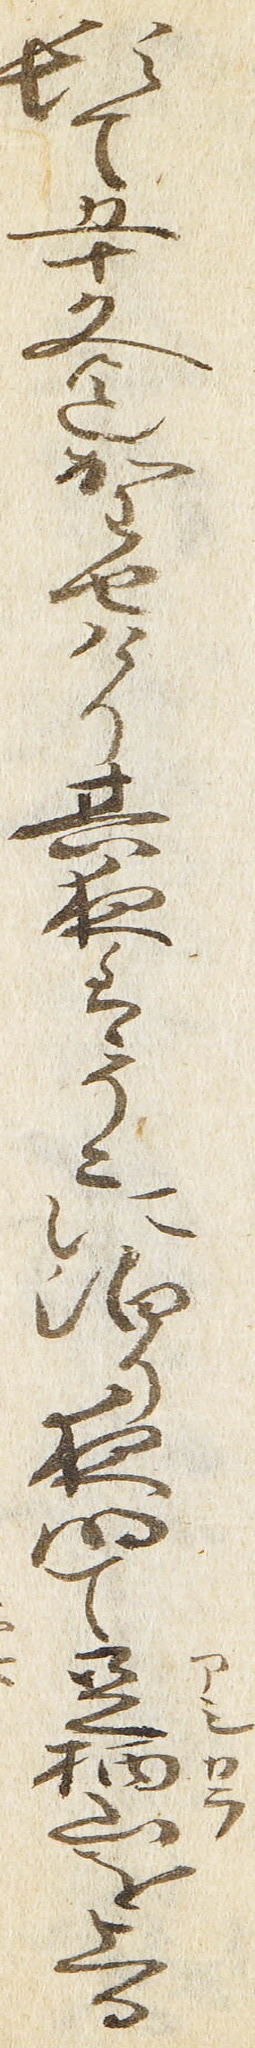頓て五十文迄かわせけり其夜はそこに泊り夜明けて足柄山を上る
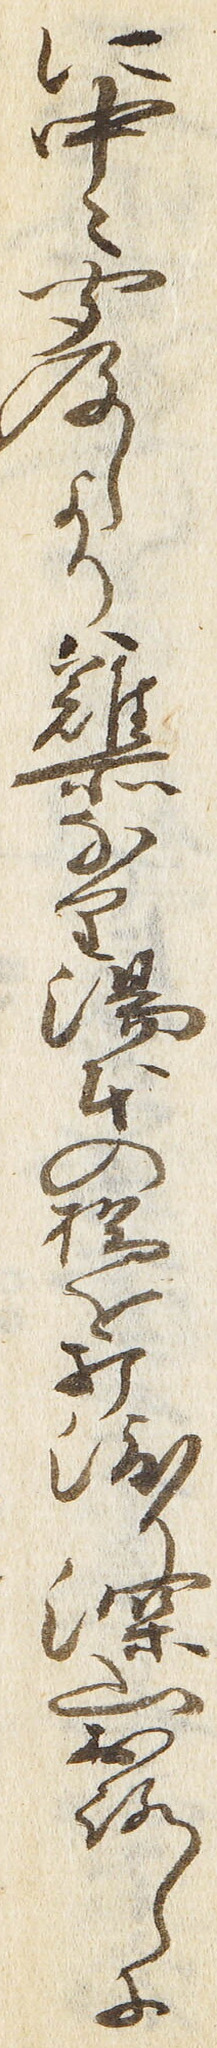に中々聞及しよりは難所なり湯本の橋を打渡り深山おろしに
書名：海陸世話日記
